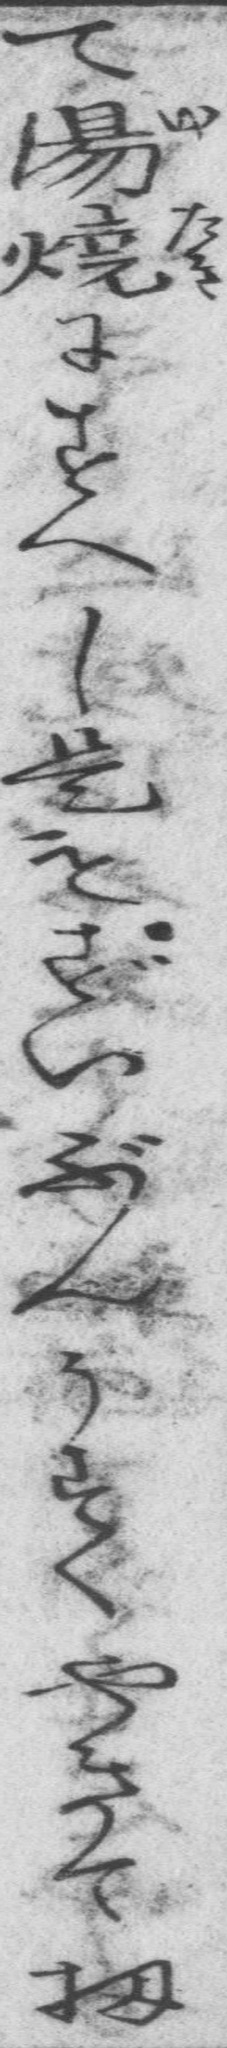て湯焼にすへし是も。ずいぶんうすくやきて扨
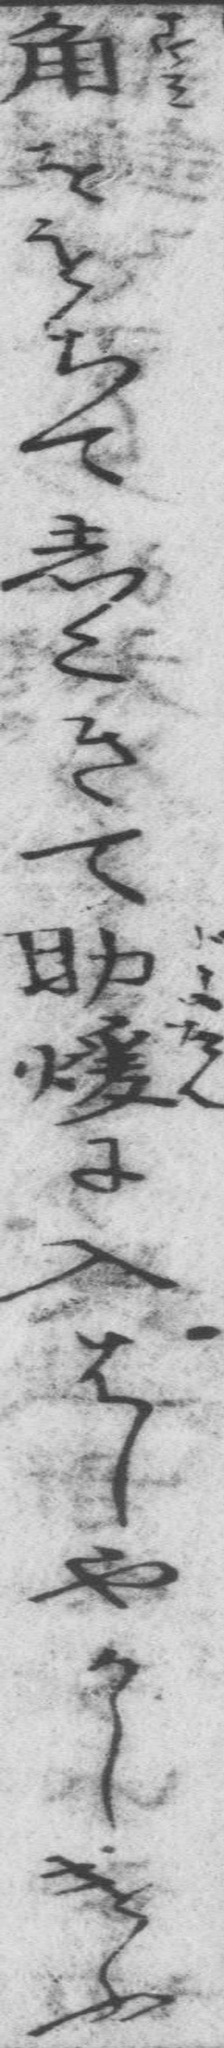角をもちてしこきて助煖に入。はしやかし遣ふ
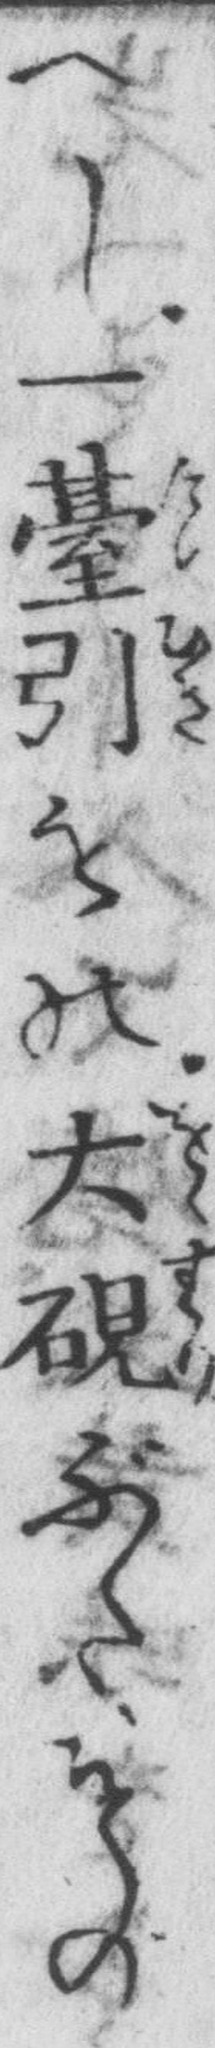へし。一台引もの。大硯ぶたもの
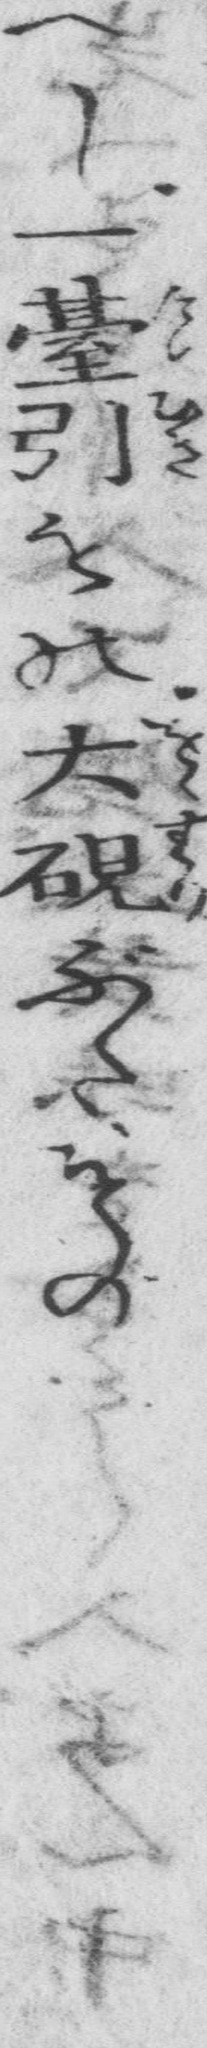へし。一台引もの。大硯ぶたもの
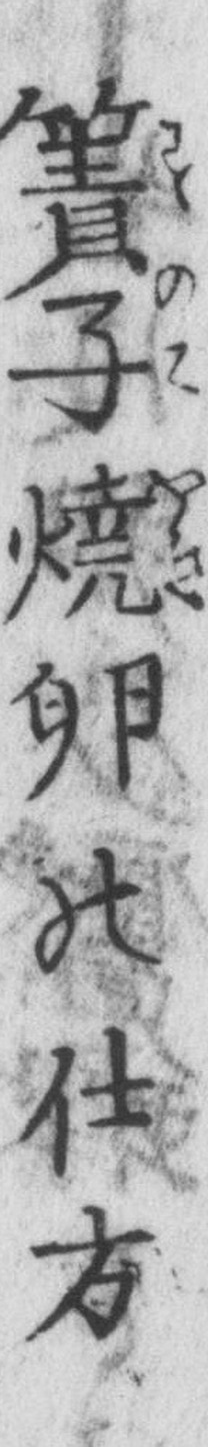簀子焼卵の仕方
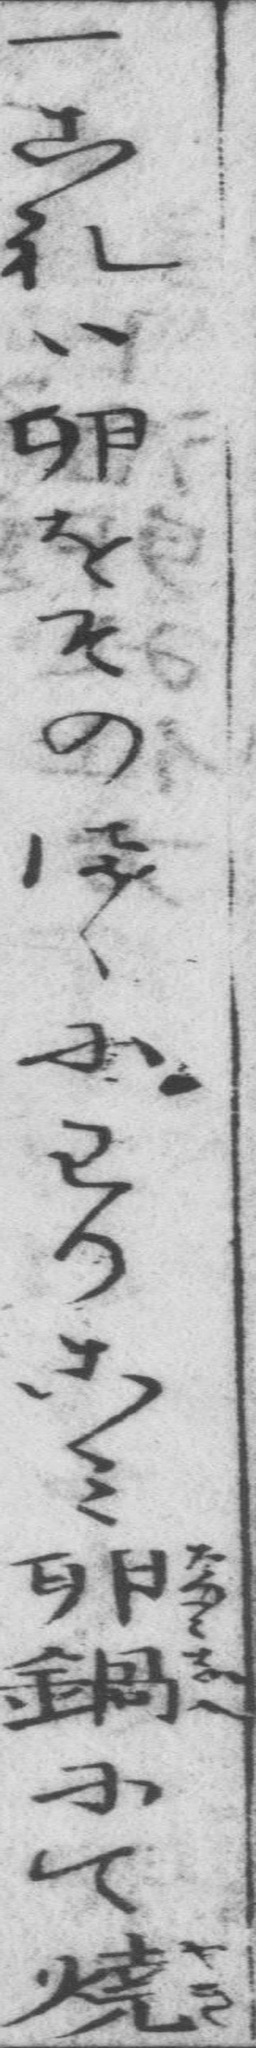一これは卵をそのまゝに。わりこみ卵鍋にて焼
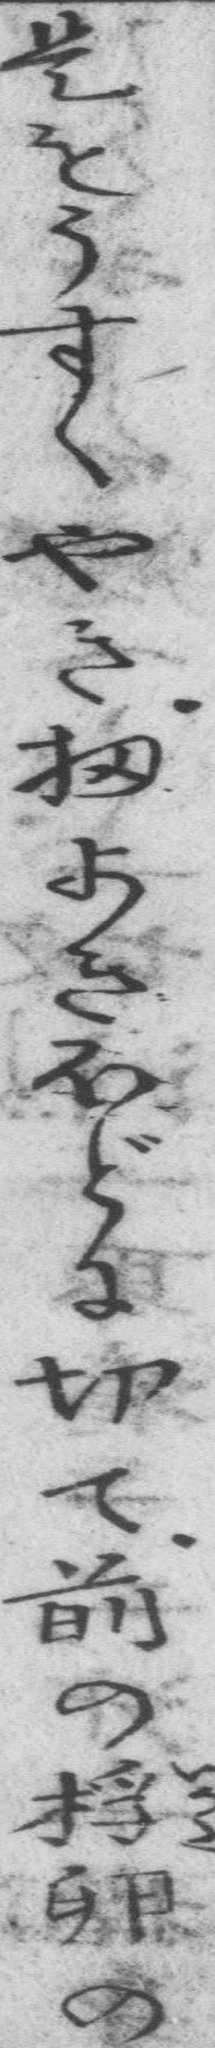是をうすくやき。扨よきほどに切て。前の桴卵の

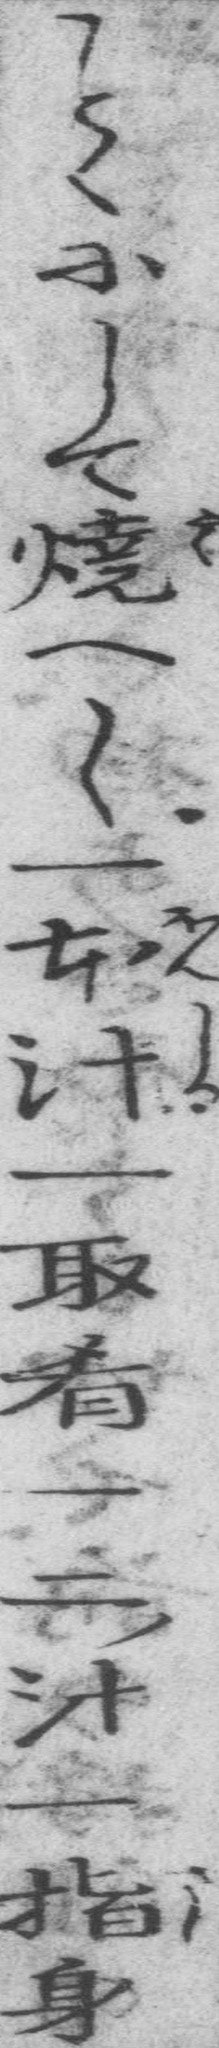ことくにして焼へし。一本汁一取肴一二の汁一指身
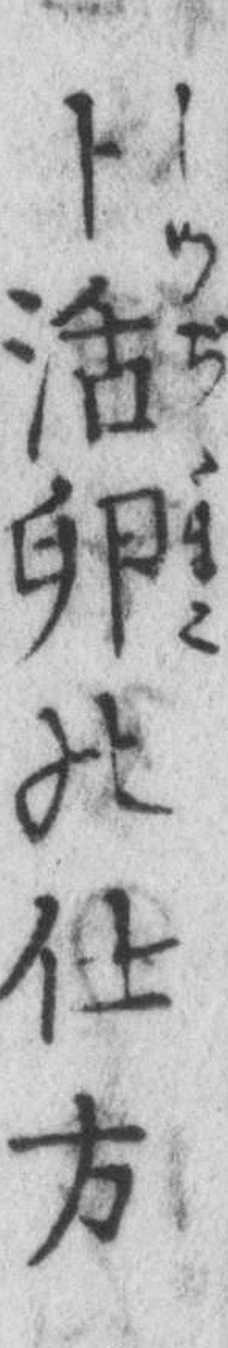〆活卵の仕方
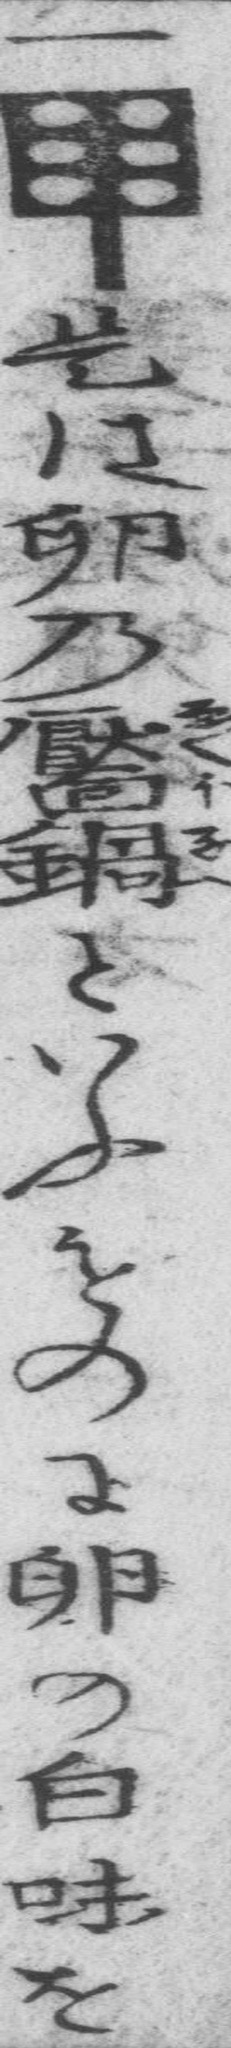一是は卵の靨鍋といふものに卵の白味を
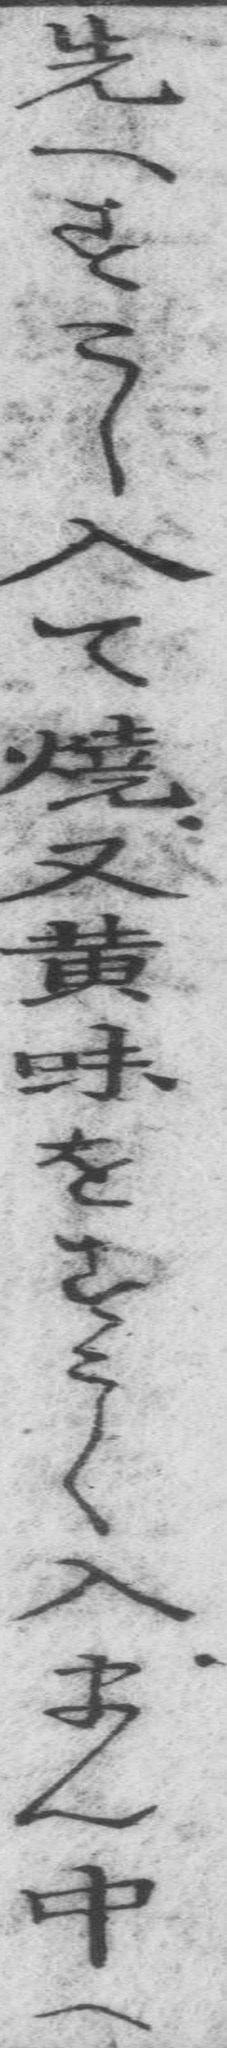先へすこし入て焼。又黄味をすこし入。まん中へ
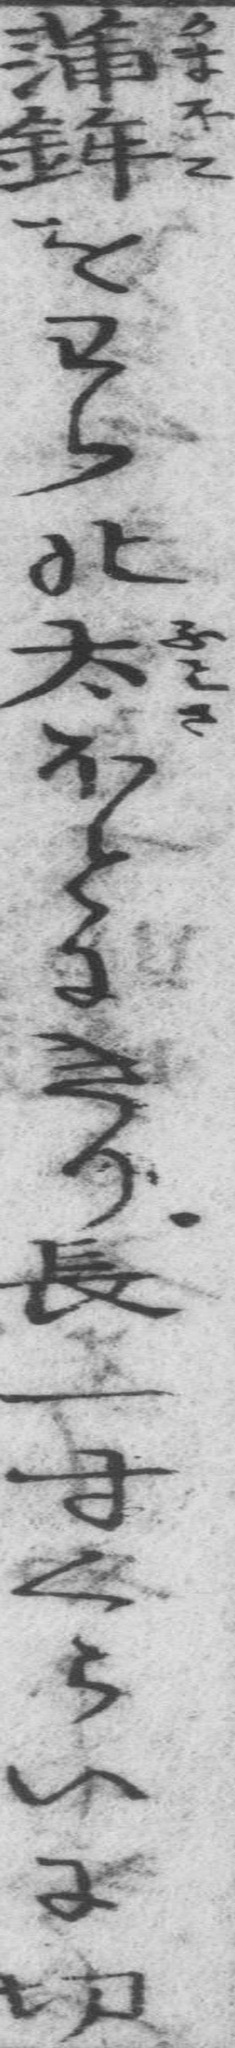蒲鉾をわらの太ほとにきり。長一寸くらいに切
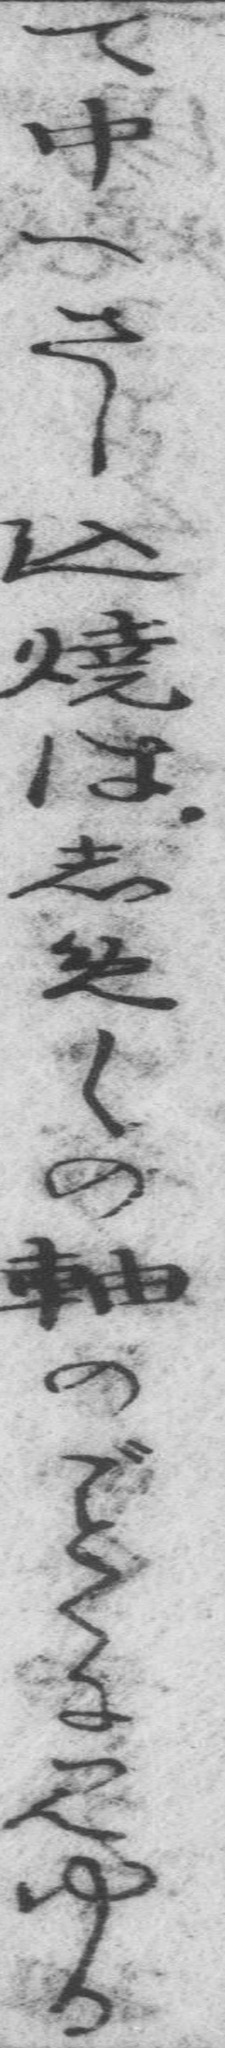て中へさし込焼は。しめしの軸のごとくに見ゆる
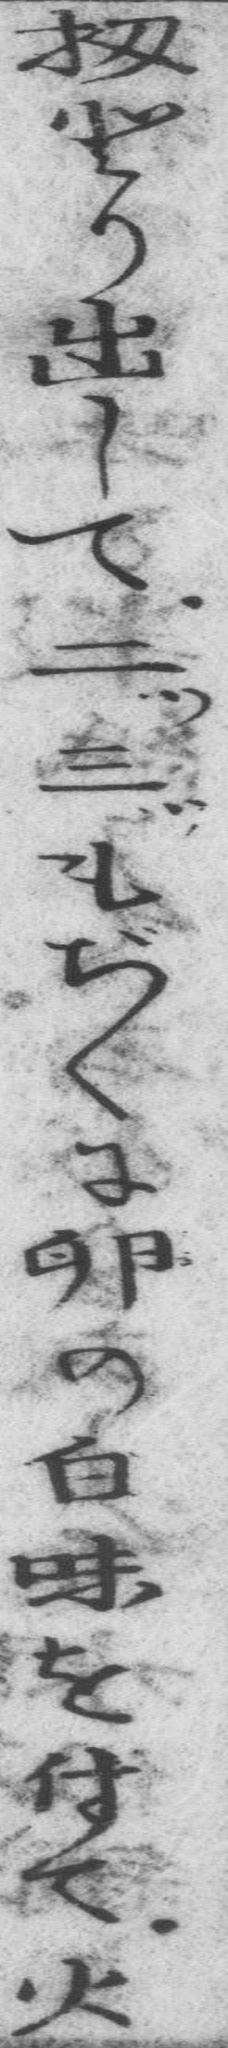扨とり出して。二つ三つもぢくに卵の白味を付て。火
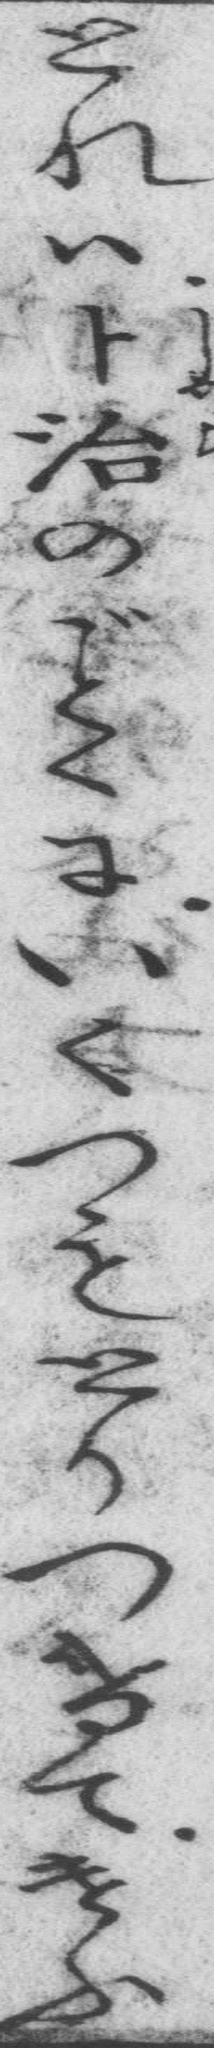とれは。〆治のごとくに。いくつもとりつけて。遣ふ
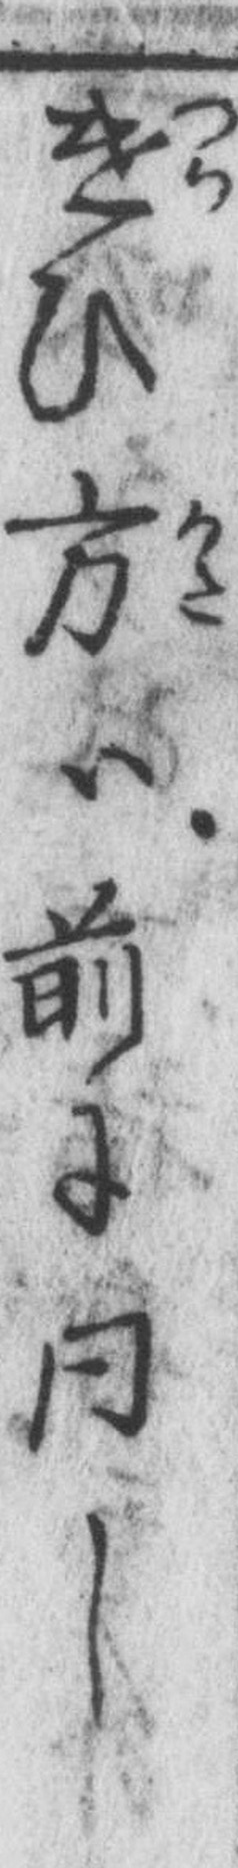遣ひ方は。前に同し
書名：萬寳料理秘密箱
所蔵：大阪府立大学学術情報センター 国文学研究資料館
